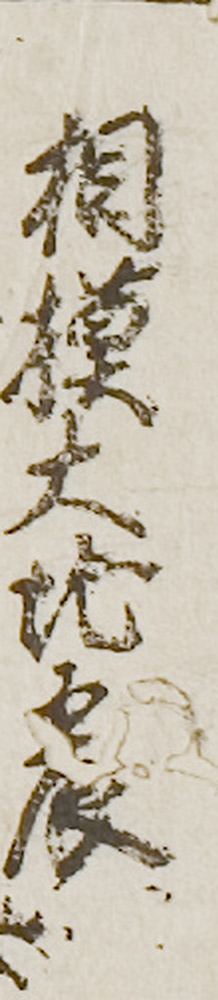相模大地震
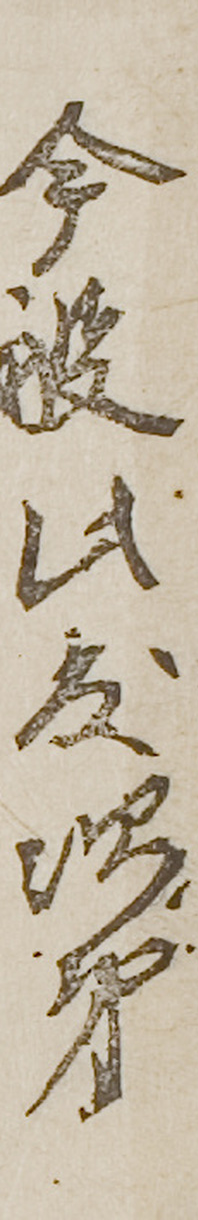今般此度次第
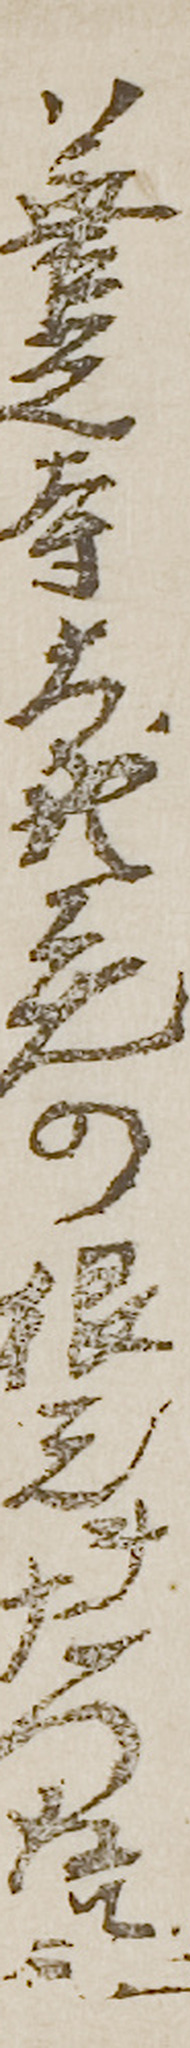善光寺大地震の根元をたつぬルニ
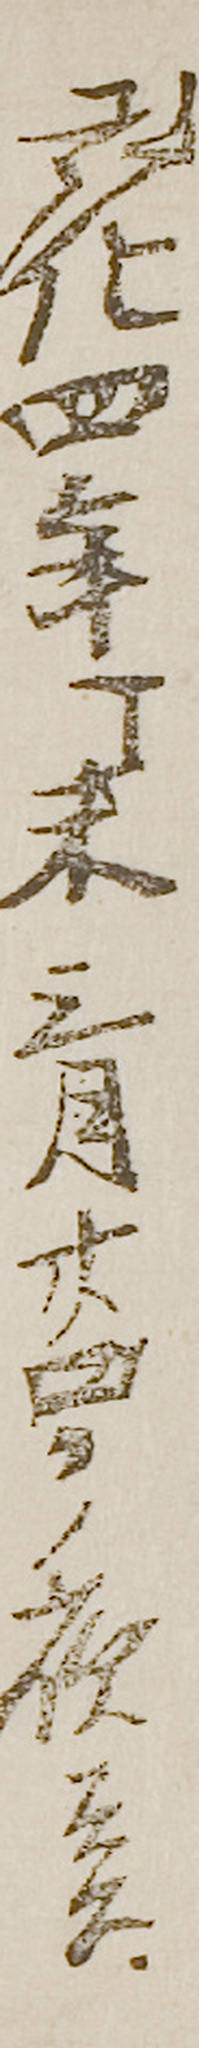弘化四年丁未三月廿四日ノ夜亥
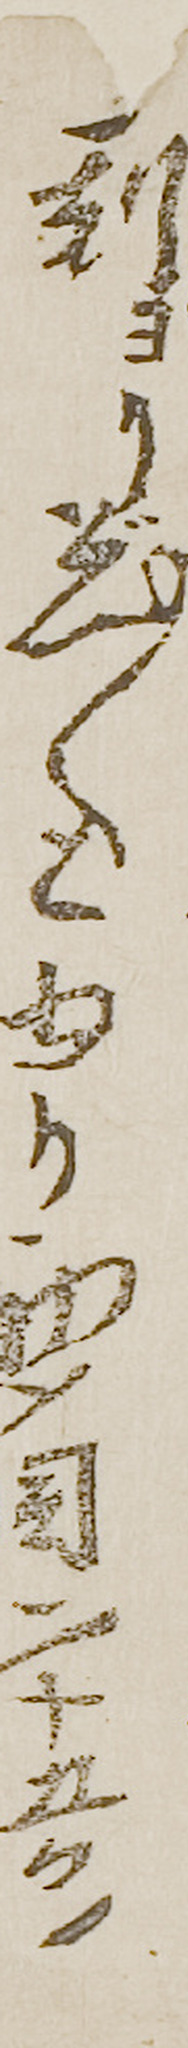刻よりどん〳〵とゆり初メ同二十五日ノ
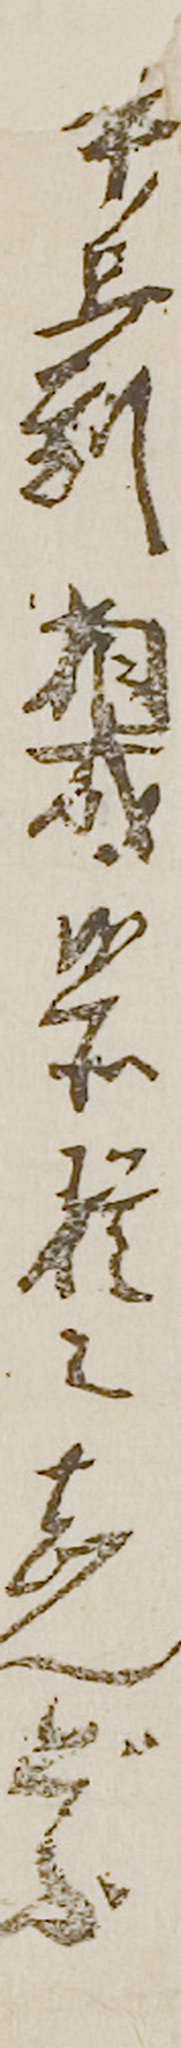午ノ上刻相成候所猶々しんどふ
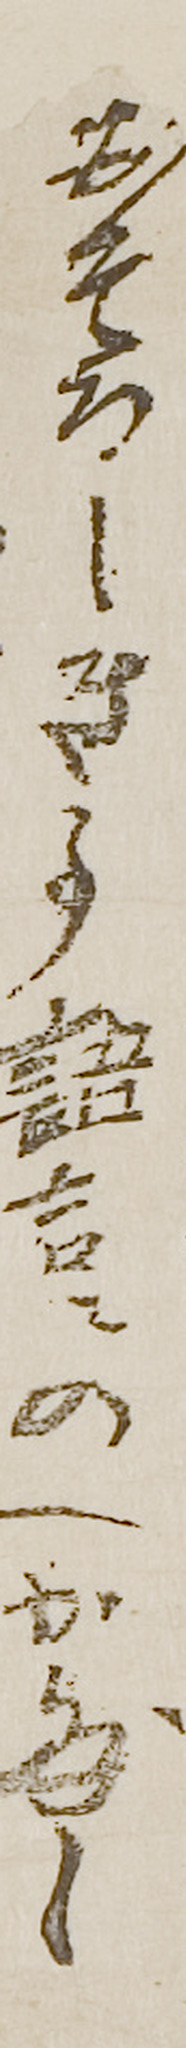おそろしき事語言にのへかたし
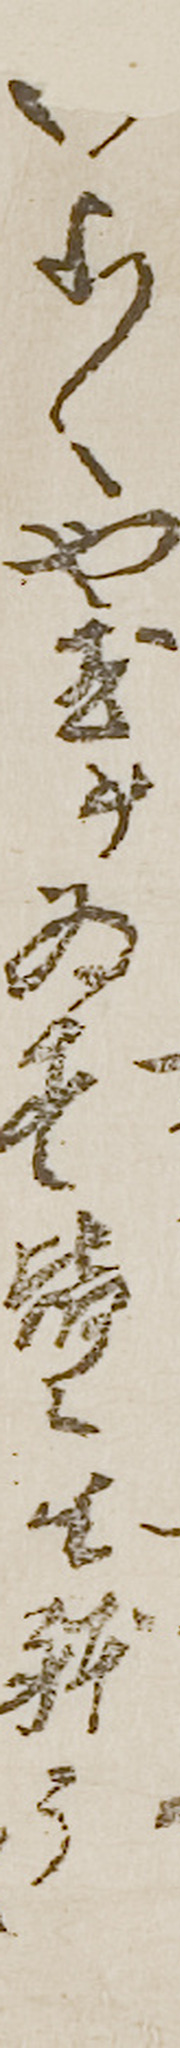いよ〳〵やむ事為す皆々生躰うし
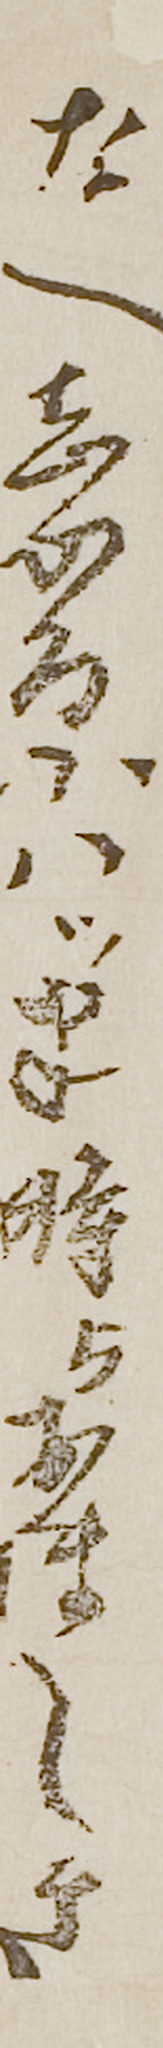なへしかるに八つ半時とおほしき
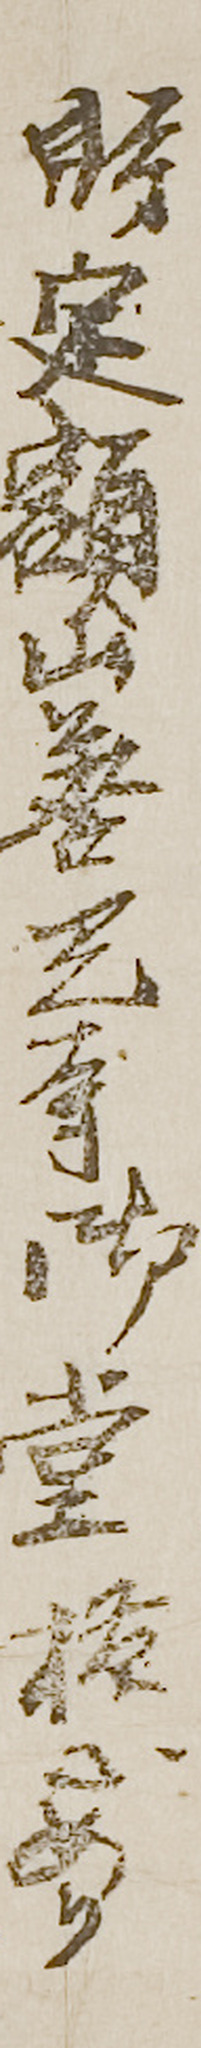時定額山善光寺御堂横にめり
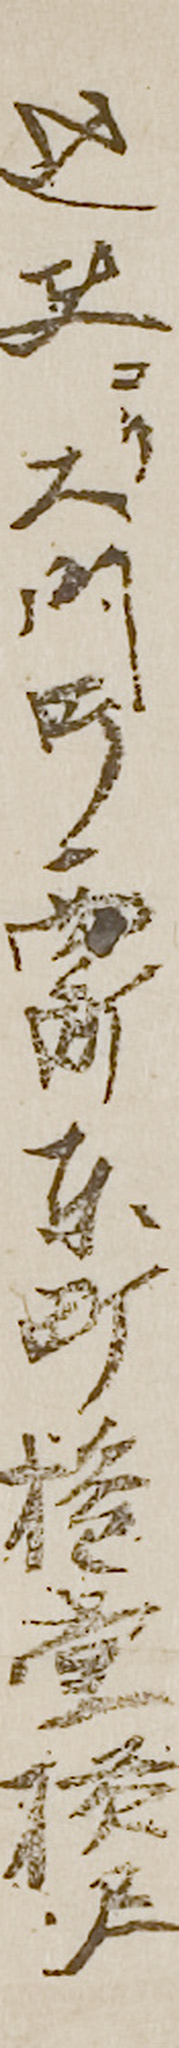込夫より大門町西町東町権堂損ふ
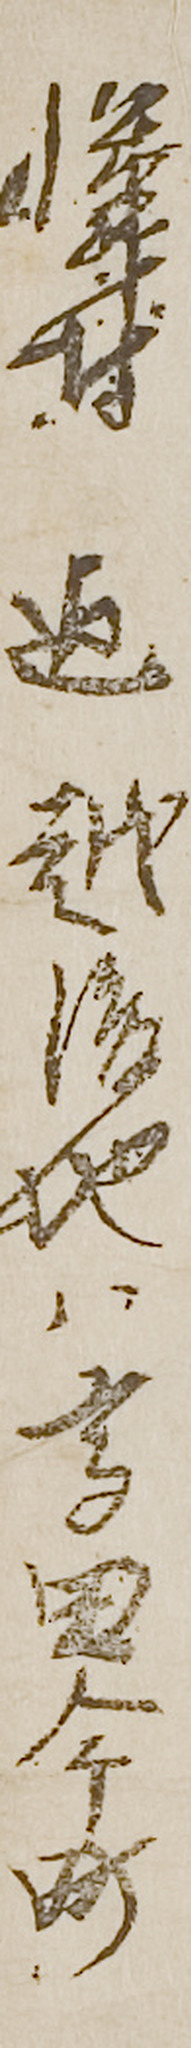隣村辺越後地は高田今町
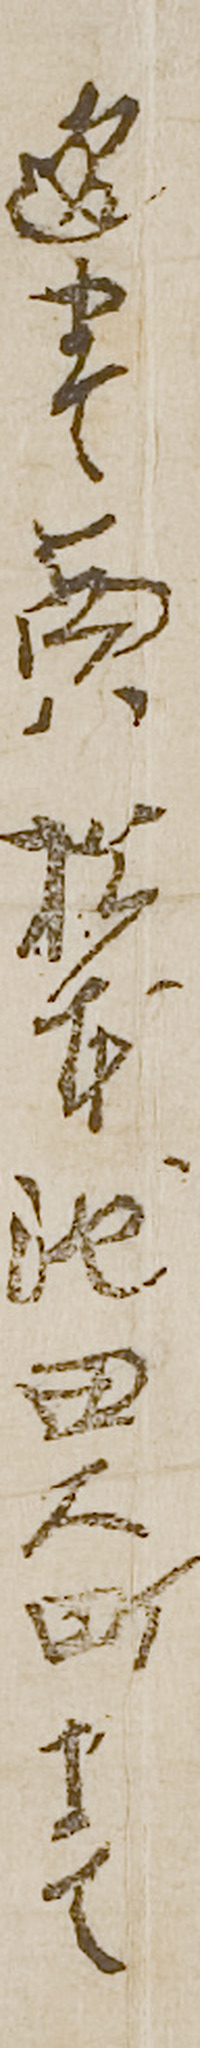辺まて西は松本池田大町まて
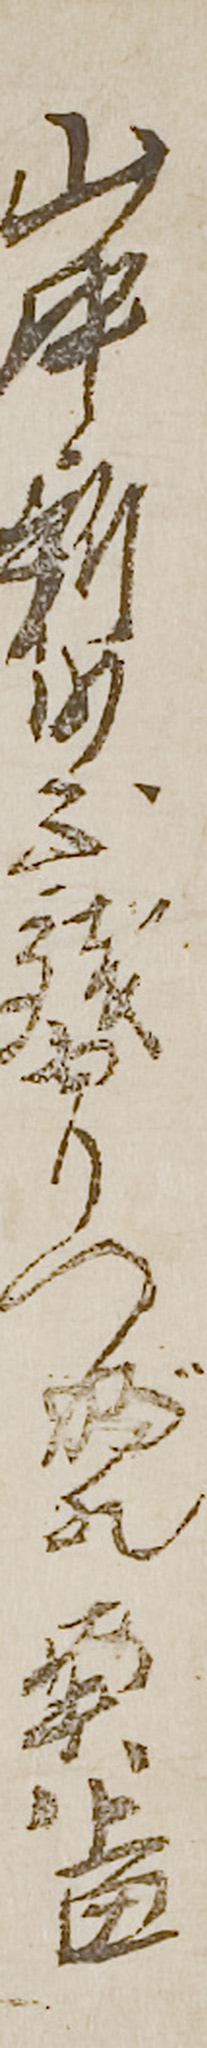山中新町不残ゆりつぶれ南は上田
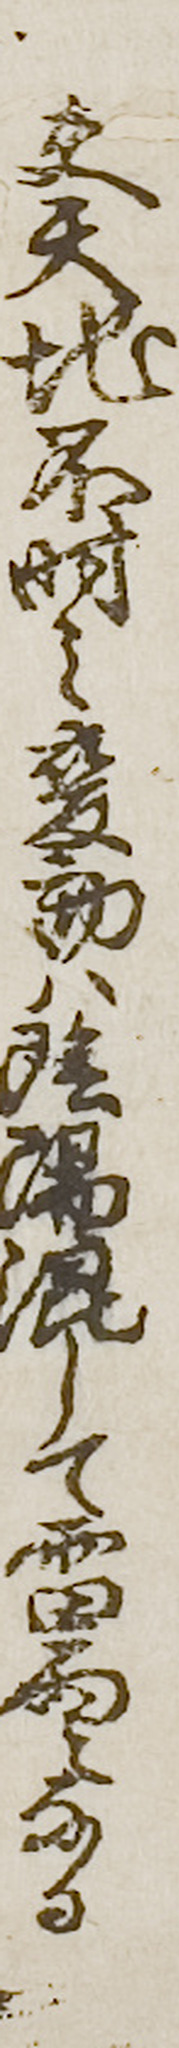夫天地不時之変動は陰陽混して雷雨となる
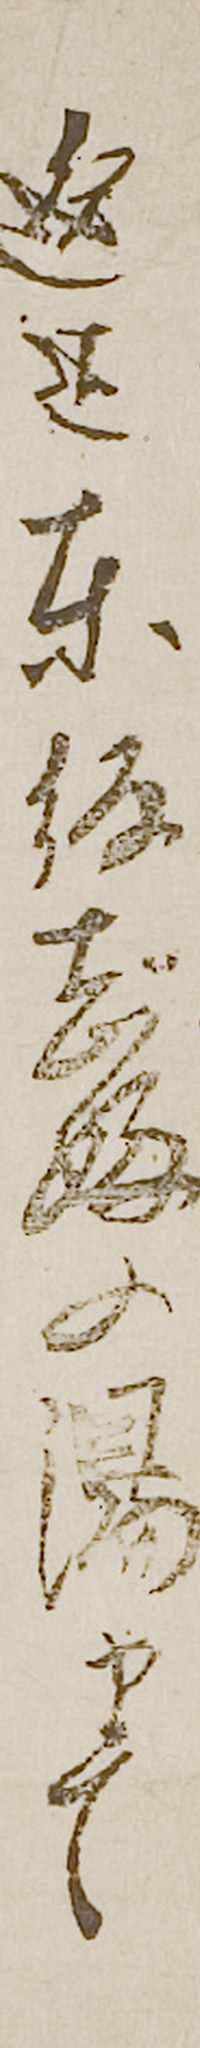辺迄東はじふの湯まて
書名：信州善光寺大ぢしんの次第
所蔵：東京大学総合図書館 General Library in the University of Tokyo, JAPAN
